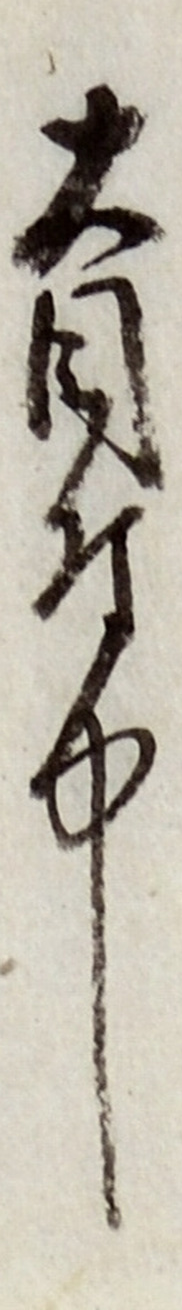大目付中
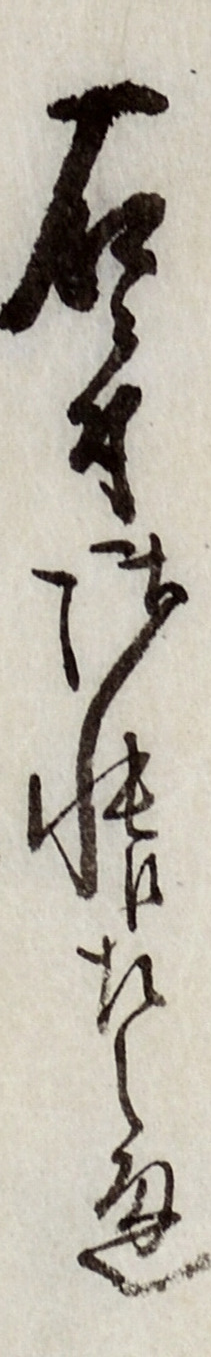右ニ付御帳江左之通
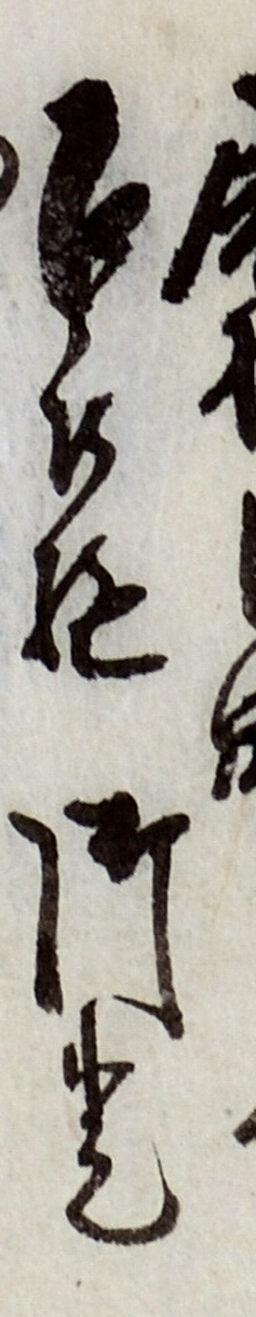召被遊御登
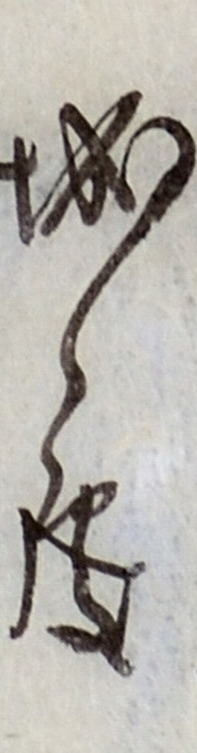城候処
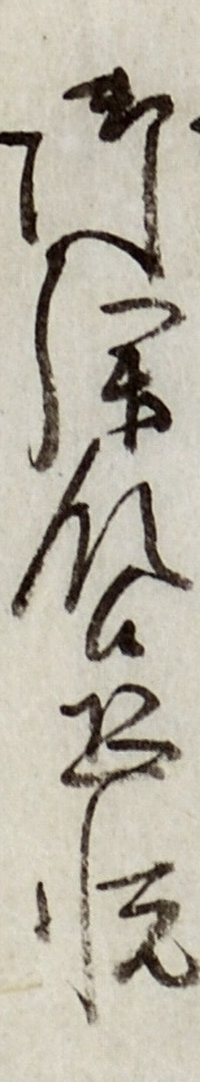御拝領候恐悦
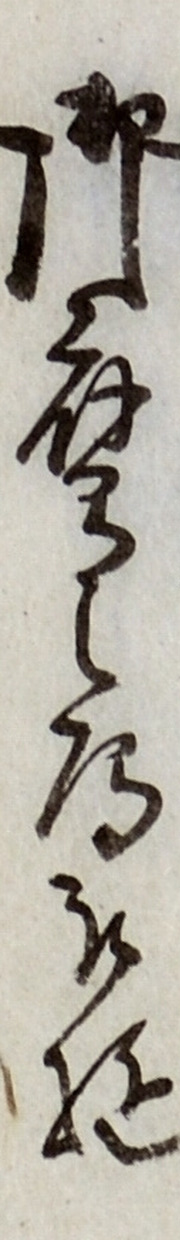御鷹之鳥被遊
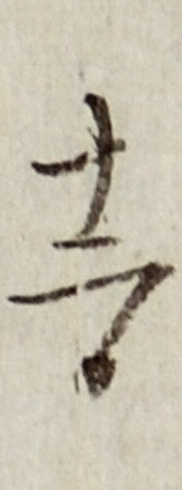十二日
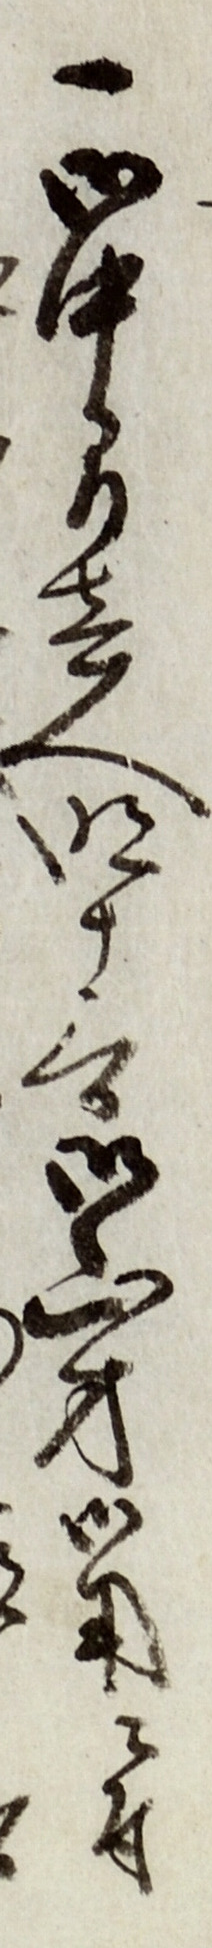一御中間壱人明十三日御山方御用ニ付
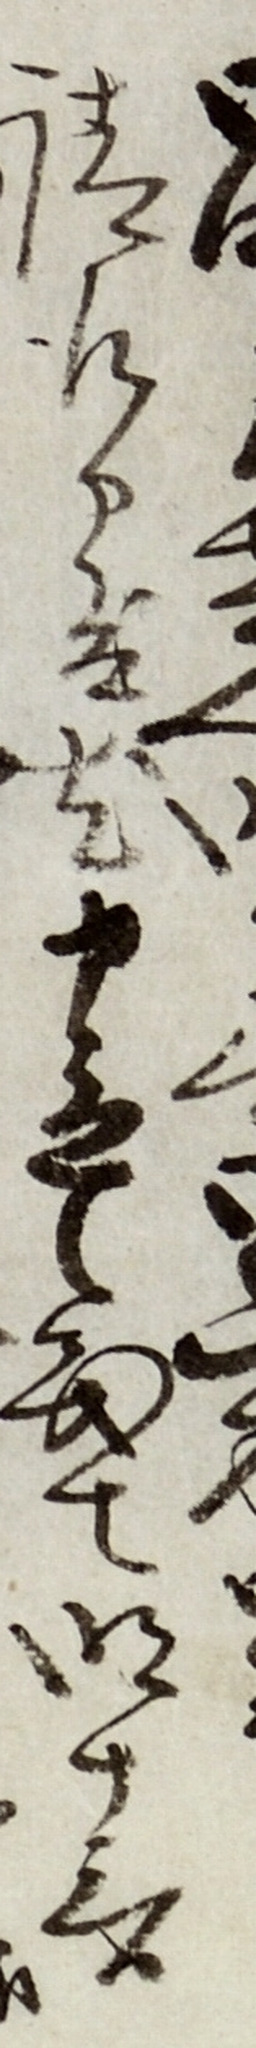請取申度尤申立之義者明十三日
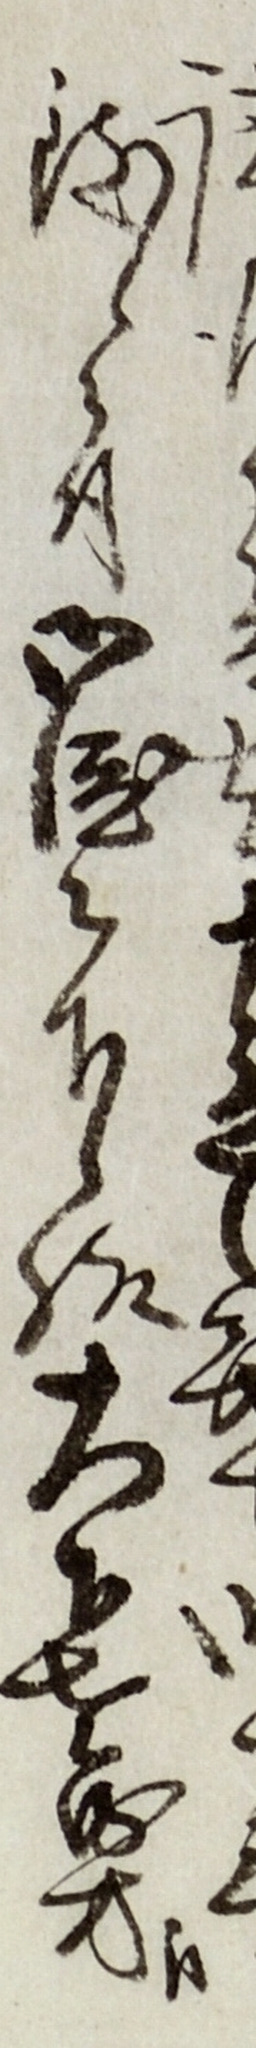致候ニ付御渡被下候様大下七兵衛方江
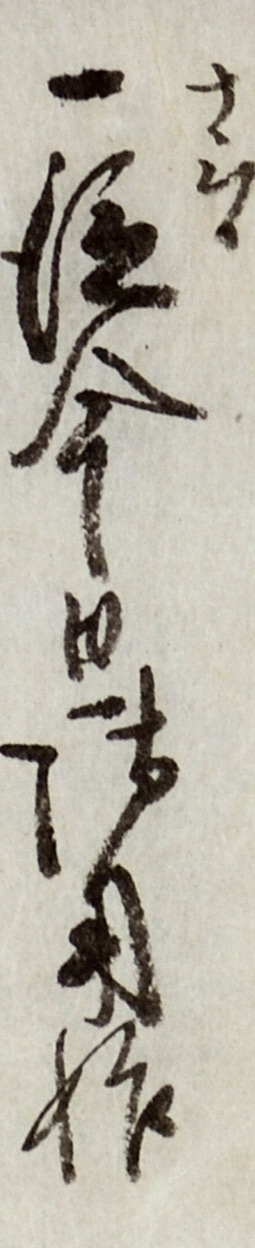一従今日御用始
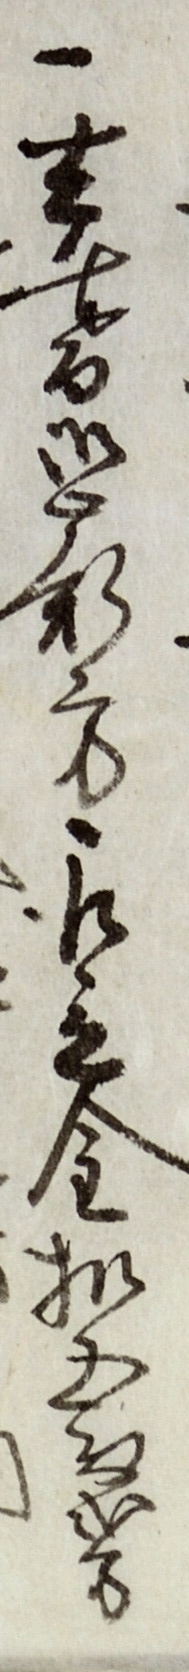一去暮御薪方取立金拾五両弐分
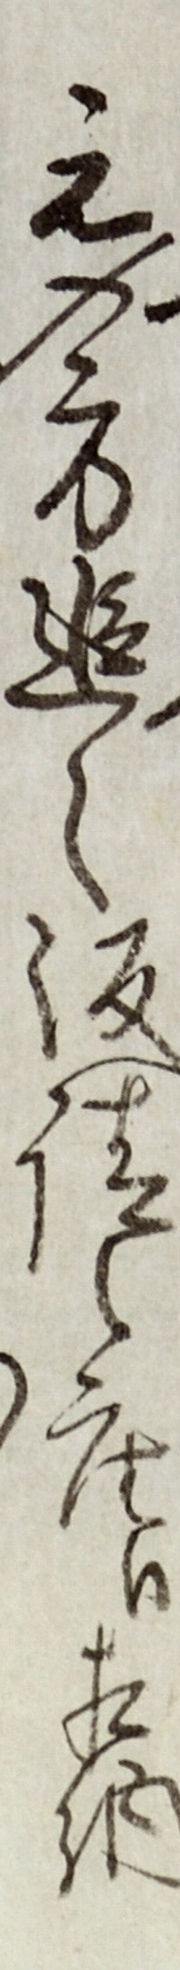元〆方追々仮請之座江相納
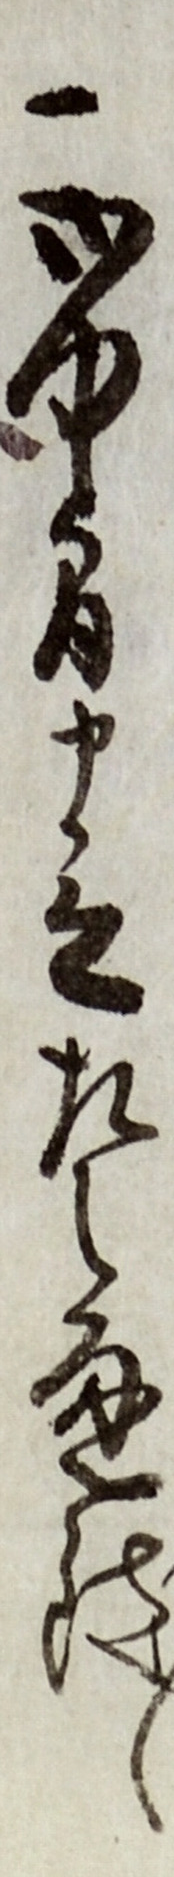一御中間申立左之通致候
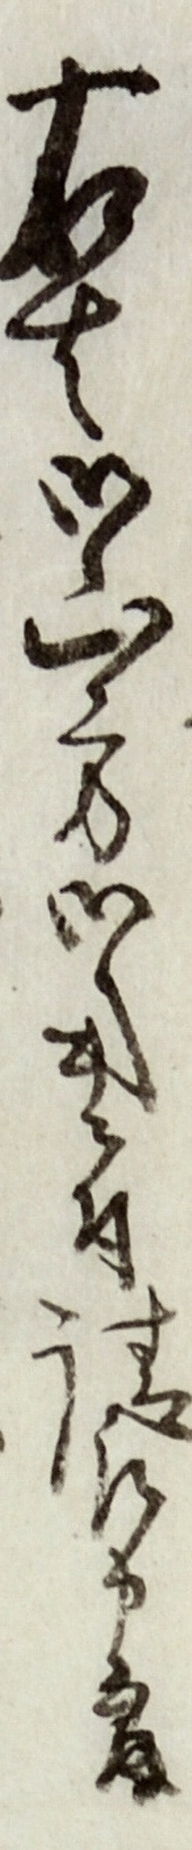右者御山方御用ニ付請取申
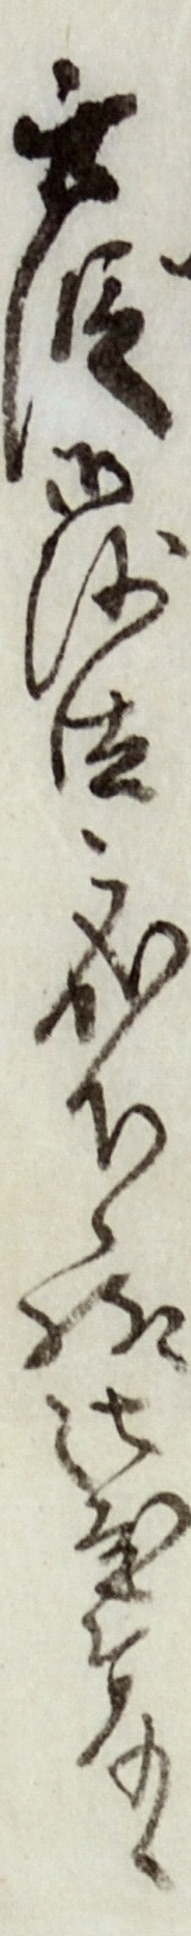其段御沙汰被成下候様仕度奉存候
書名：御山方御薪方諸事御用留
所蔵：伊那市立高遠町図書館・合同会社AMANE
